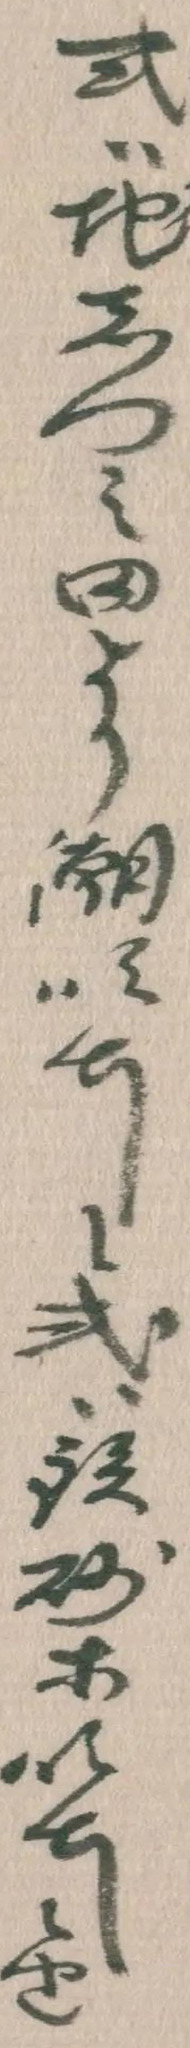或は地しつみ田より潮吹出し候或は鉄砂等吹出し候由
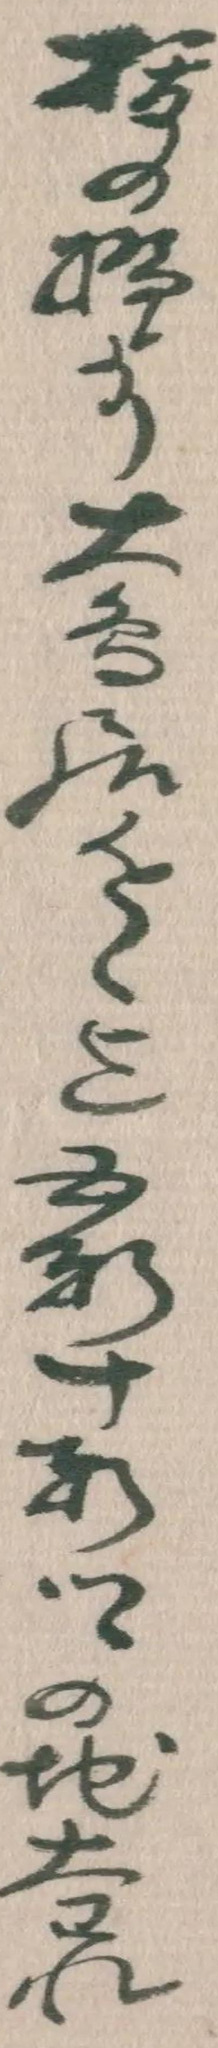抜の橋より大鳥居近く迄五軒十軒つゝの地大われ
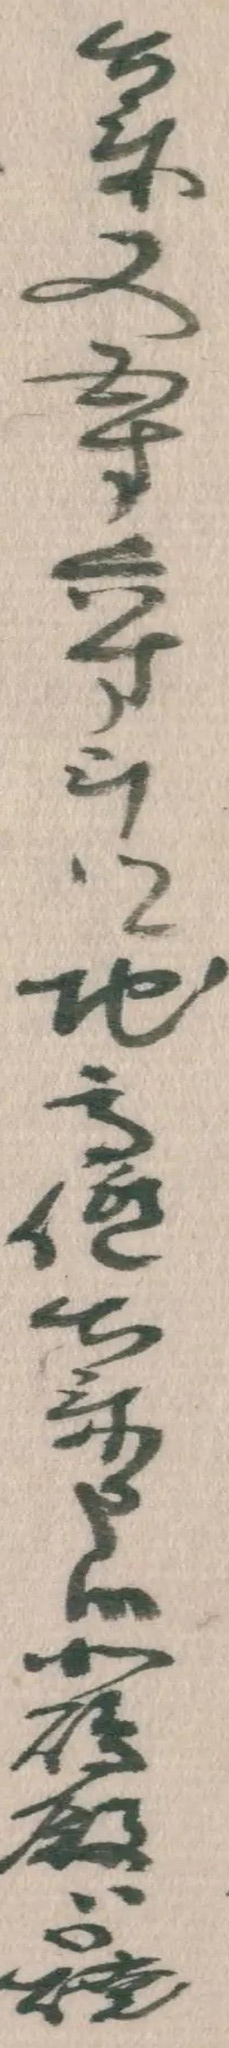出来又五寸六寸計つゝ地高低出来申候北嶋殿は御焼
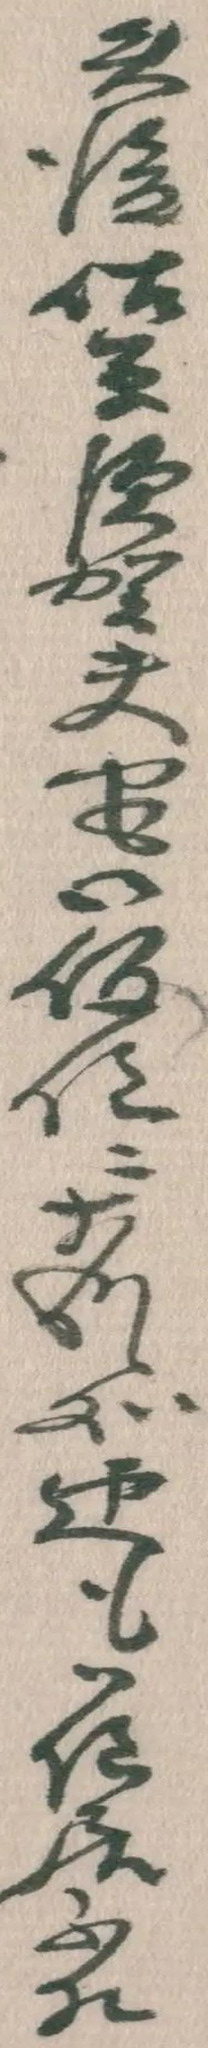失後佐原須賀夫宅御住居に相成候処迚も御住居不相
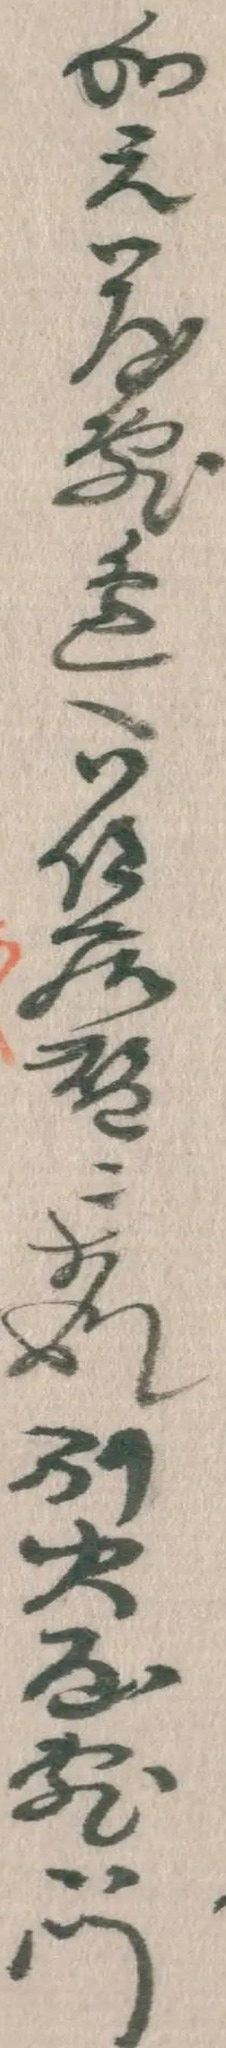成元屋敷辺へ御住居替に相成候別火屋敷は門
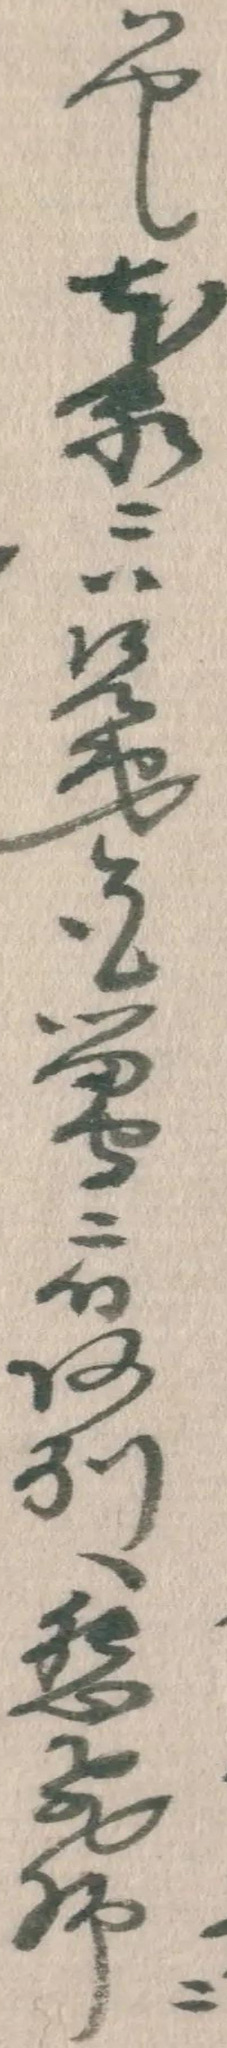御坐候本家には兄弟とも留守に付阿州へ懇飛脚
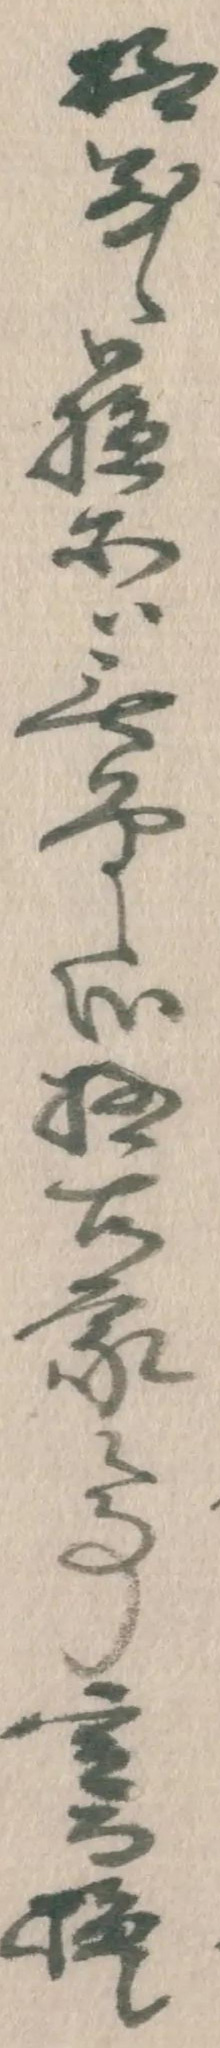格別之御損所は無御坐候処極古家之事定而損候

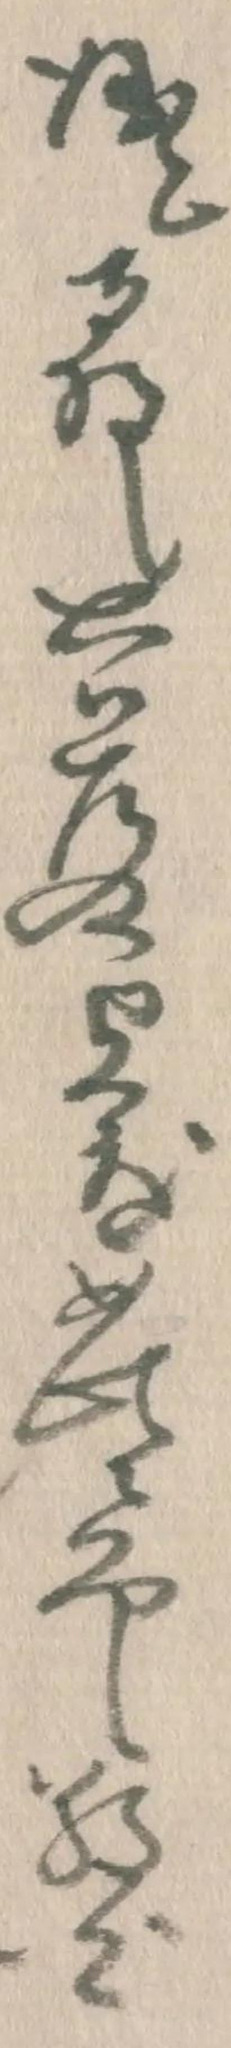儀と奉存候右御左右申上度如此御坐候敬白
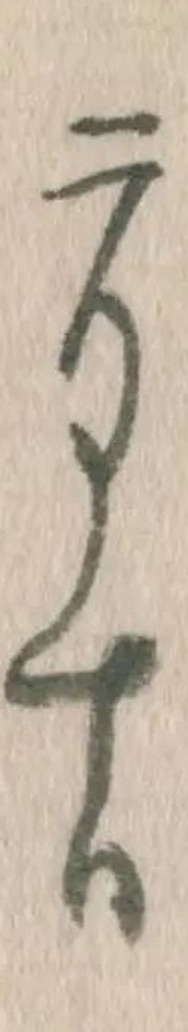二月十日
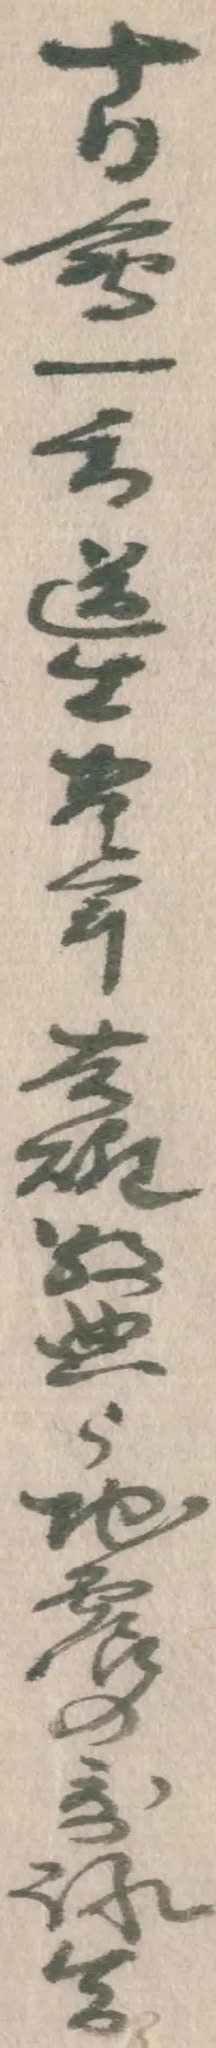十日会一香道生豊年吉雄敬典被地震の哥詠今日
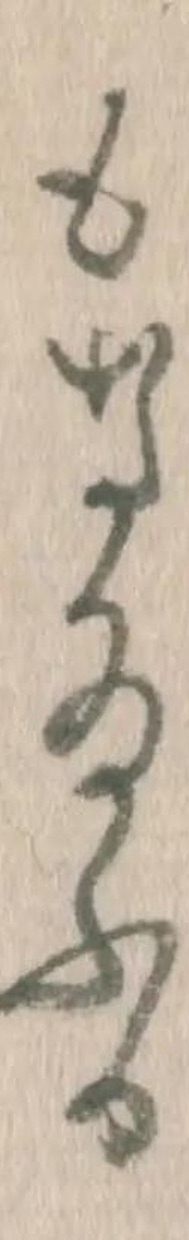もなゐふる
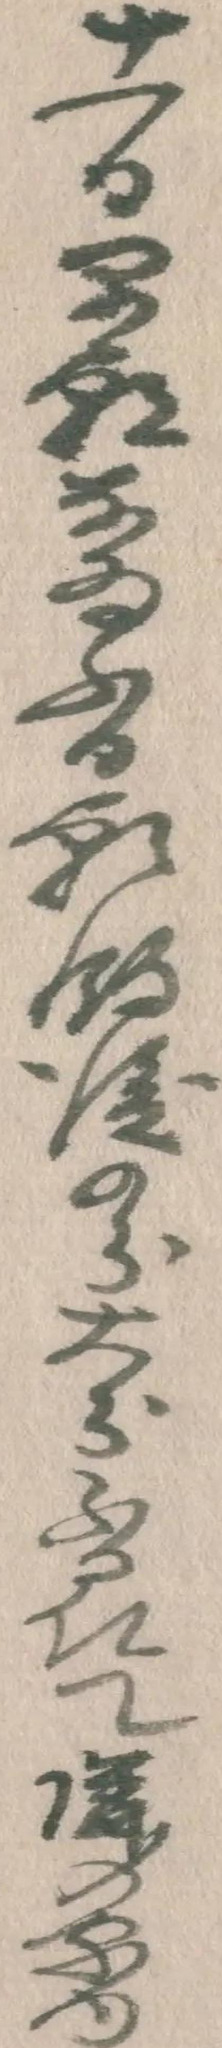十一日早朝なゐふる朝飯後の分大分ふるひて隣の家内
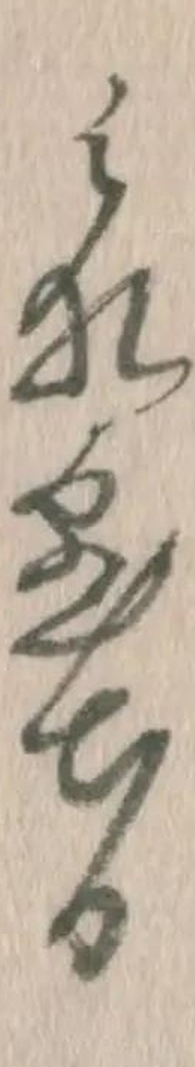はな懸出る
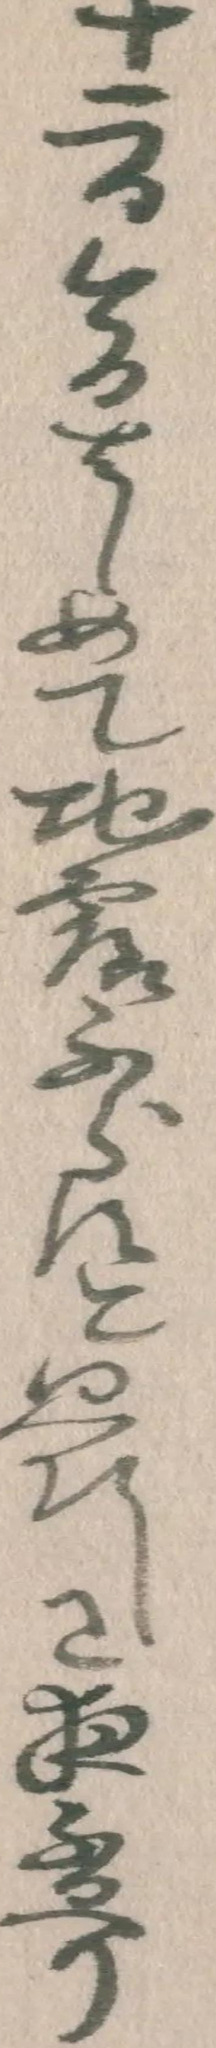十二日今日はしめて地震ふらすと思ひしに夜ふるへり
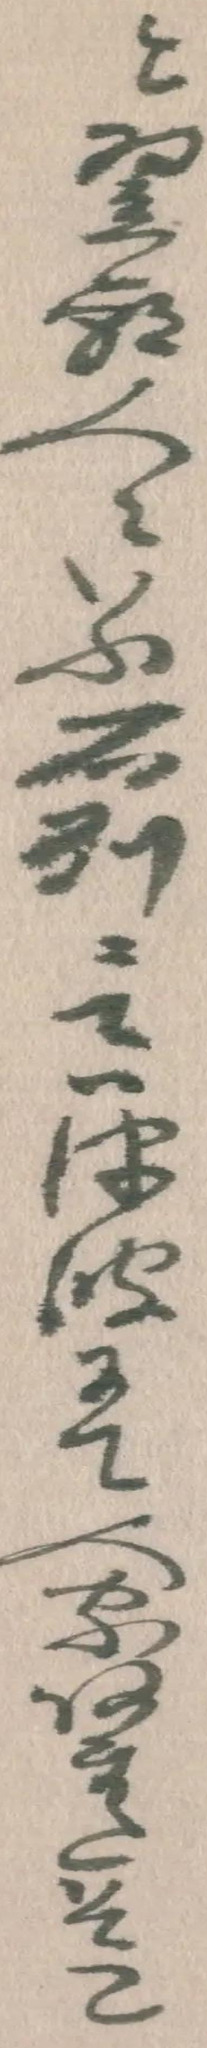と翌朝人々いふ石州にては津波にて人家あまたそこ
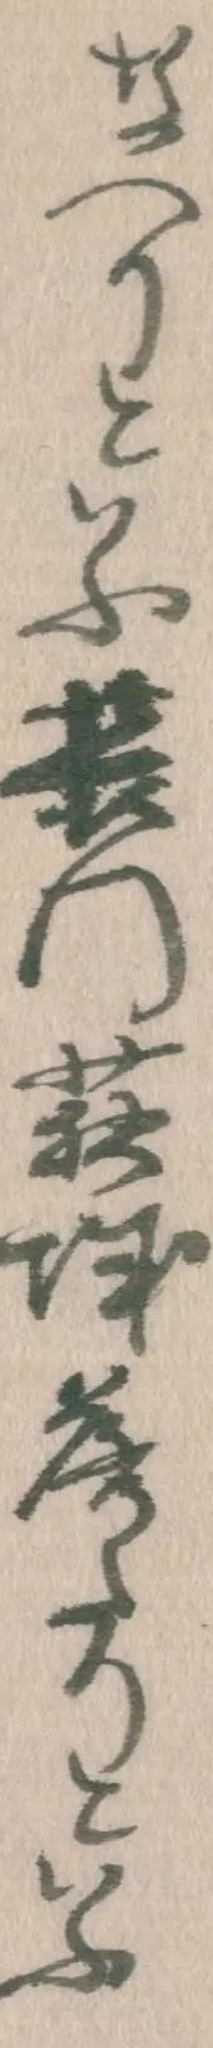なへりといふ長門萩城落たりといふ
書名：出雲紀行. 20
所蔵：国立国会図書館 National Diet Library, JAPAN
